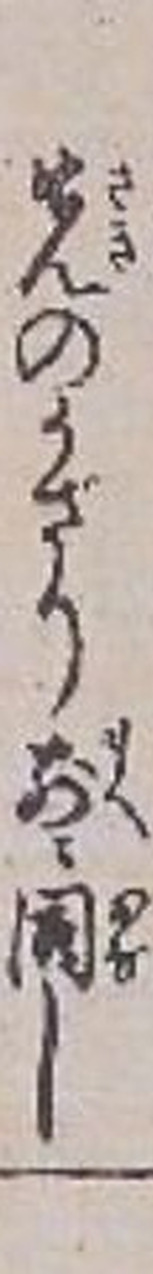先のかざり前に同し
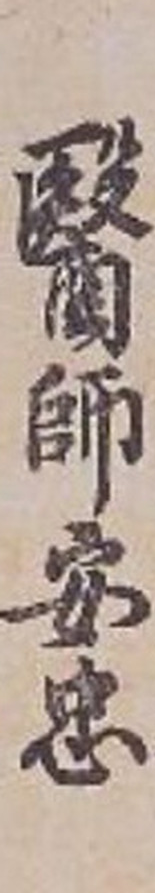醫師安忠
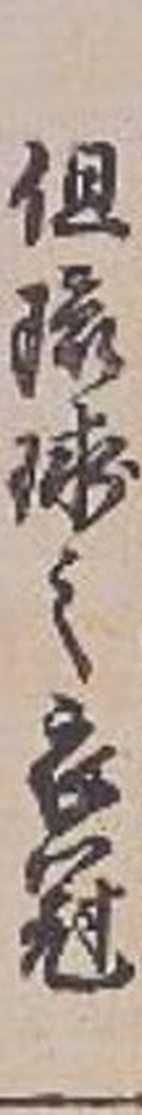但琉球衣冠
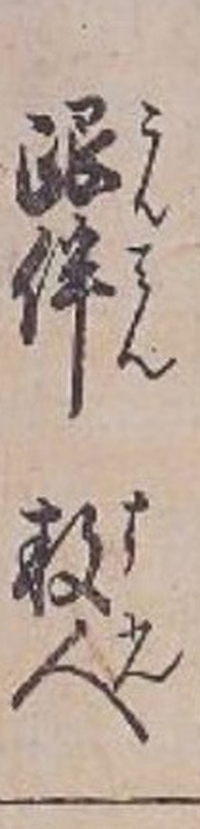跟伴数人

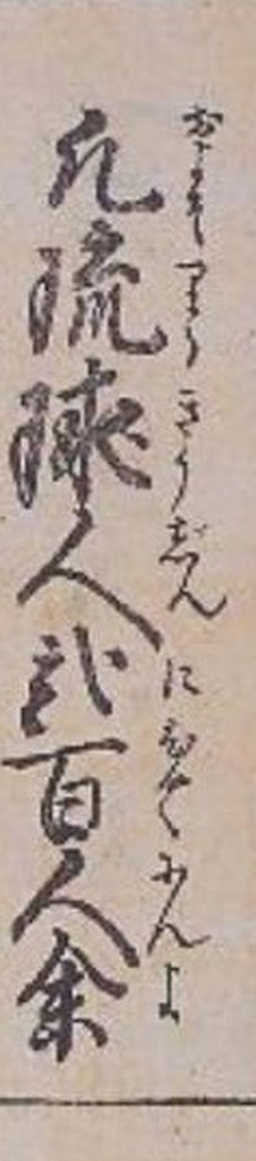凡琉球人弐百人余
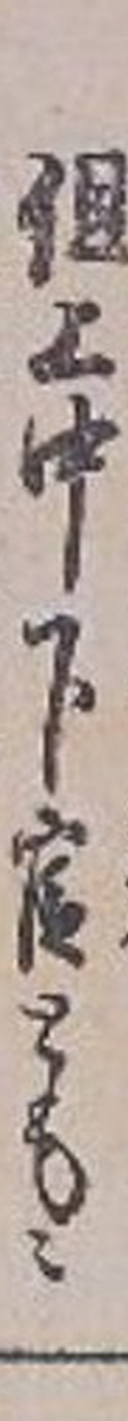但上中下官ともに
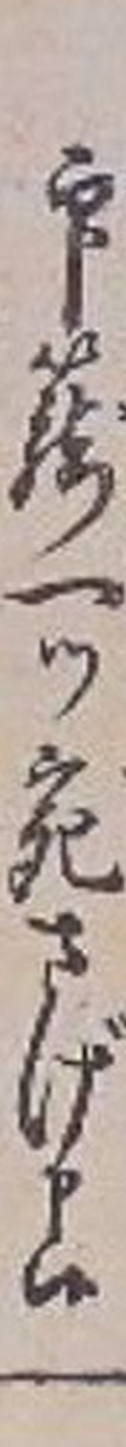印籠一つ宛さげ申候
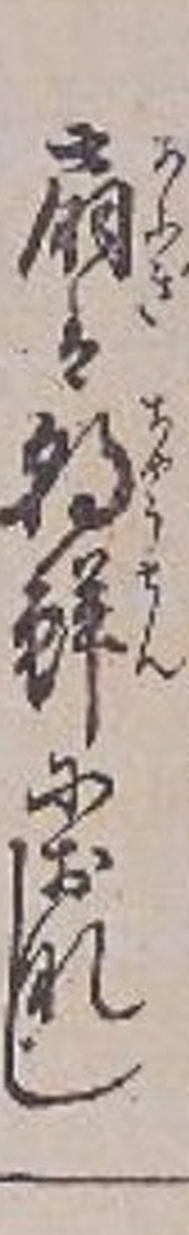扇は朝鮮におなじ
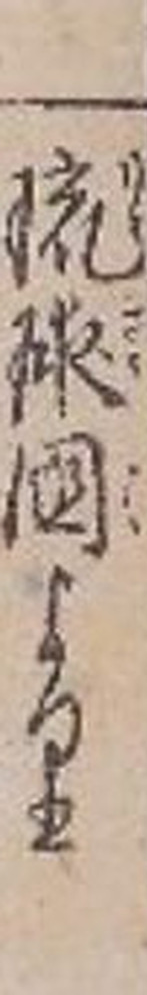琉球国より
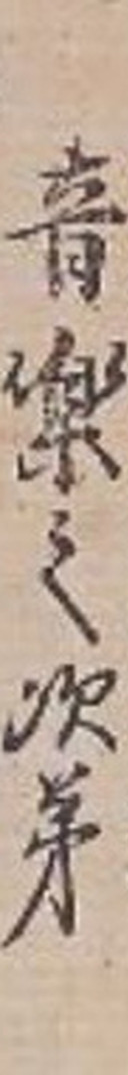音楽之次第
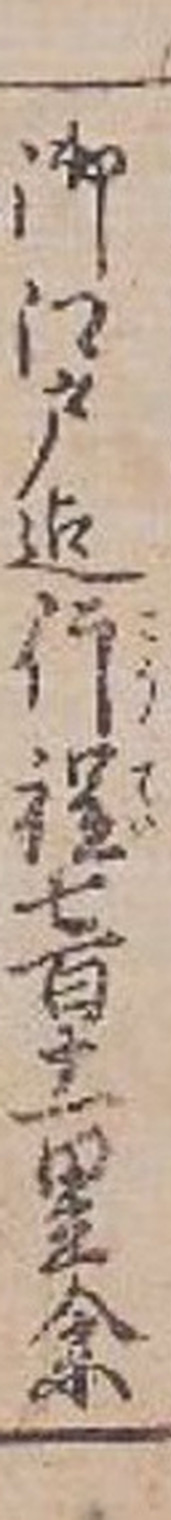御江戸迄行程七百十一里余
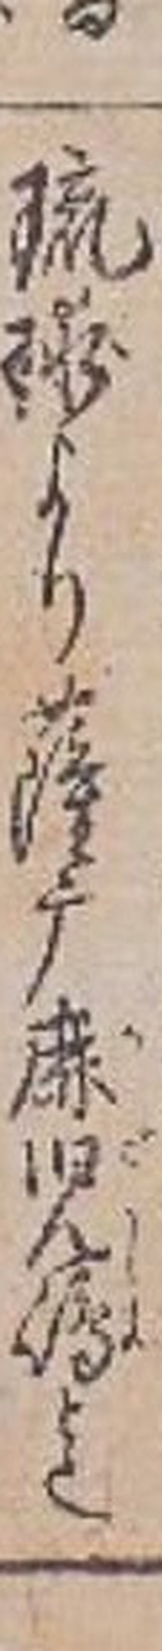琉球より薩摩鹿児嶋迄
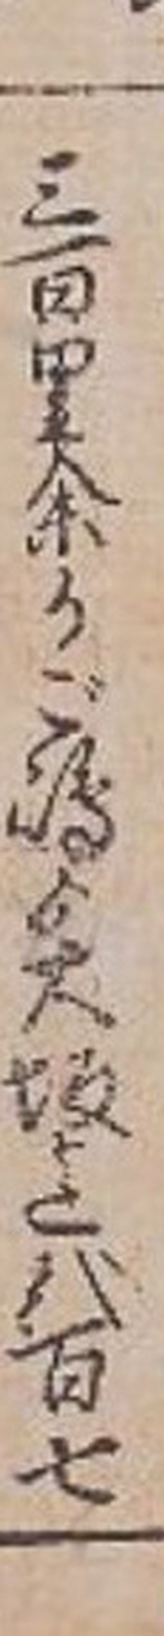三百里余かご嶋より大坂迄弐百七
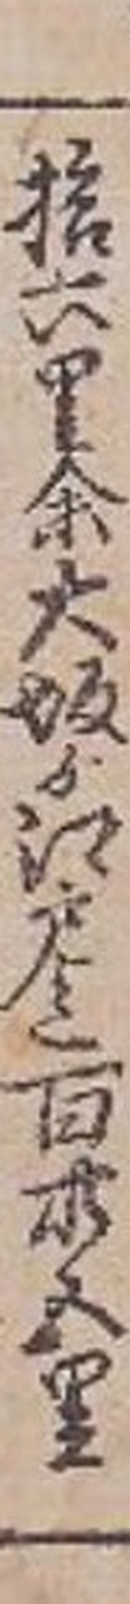拾六里余大坂より江戸迄百丗五里
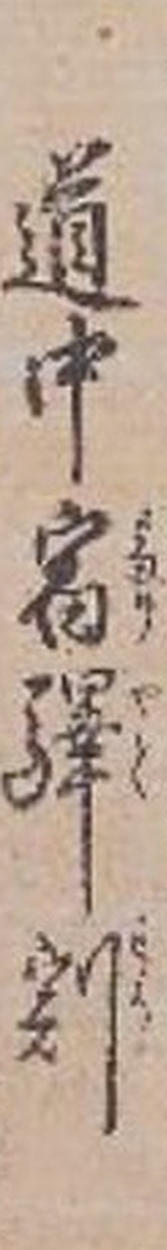道中宿驛割
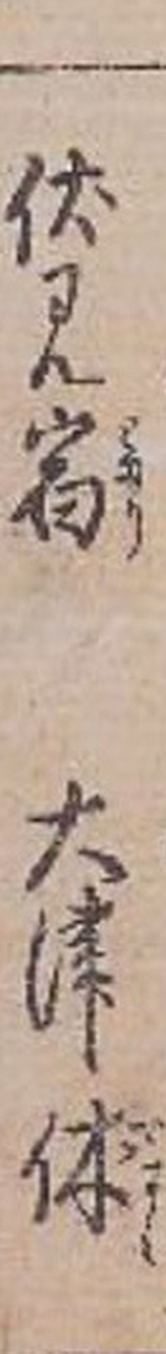伏見宿大津休
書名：琉球人大行列記 大全 来朝新板絵入
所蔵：University of the Ryukyus Library
